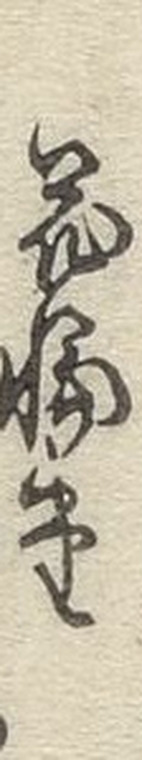花輪堂
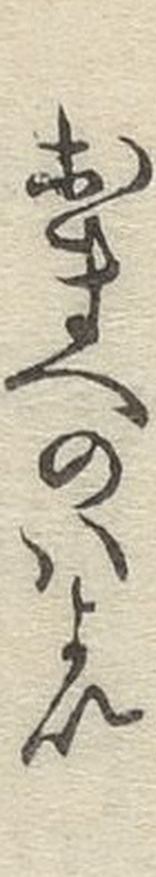おまへのはよい
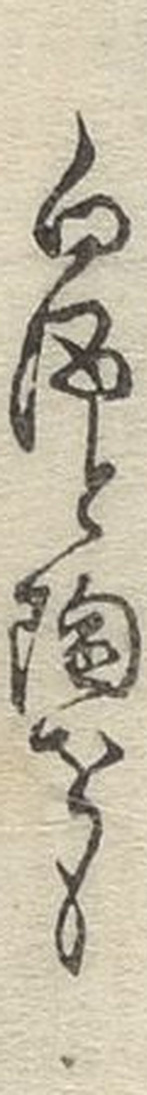白酒と陶をも
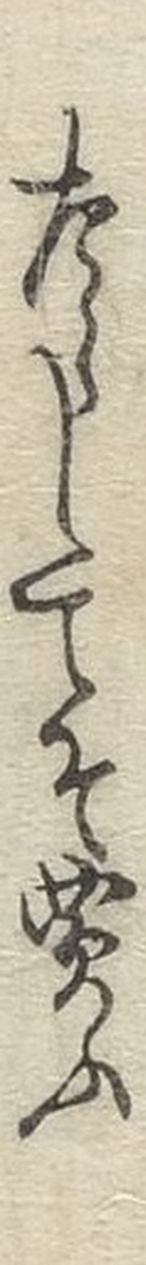たらしてそ買ふ
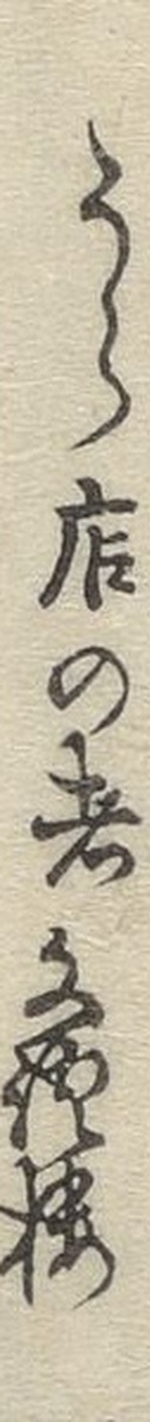うら店の者文語楼
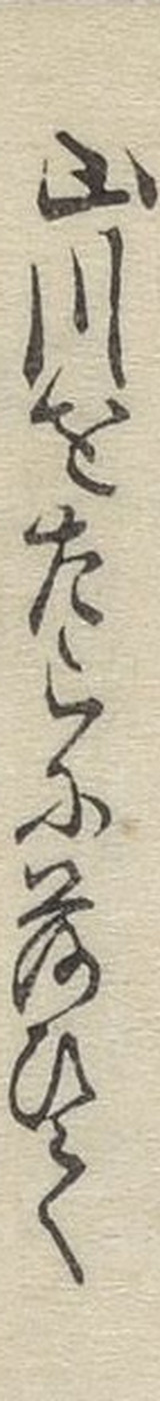山川をたこに荷ひて
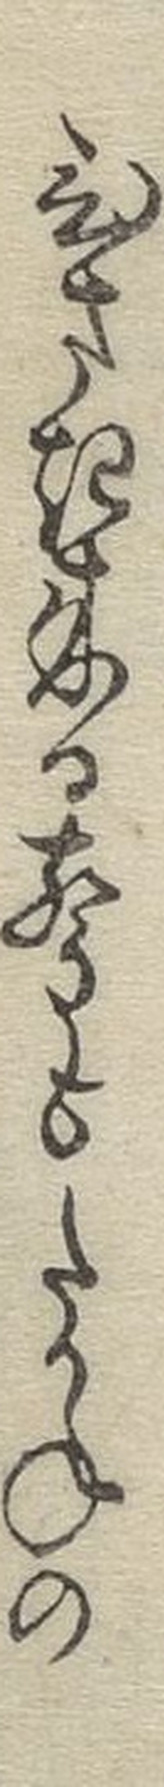ひさき来る聲もたかねの
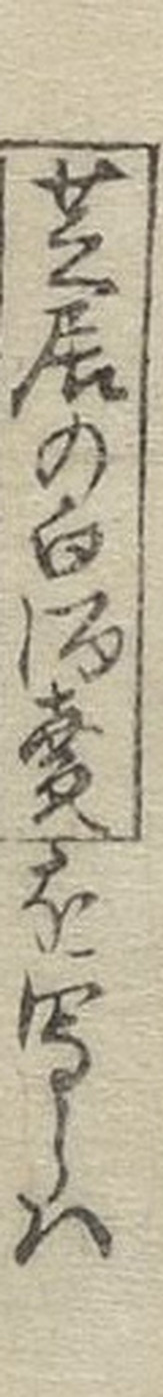芝居の白酒売を写候は
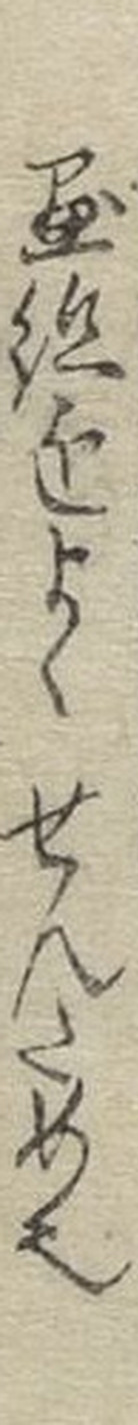画組をよくせんため也
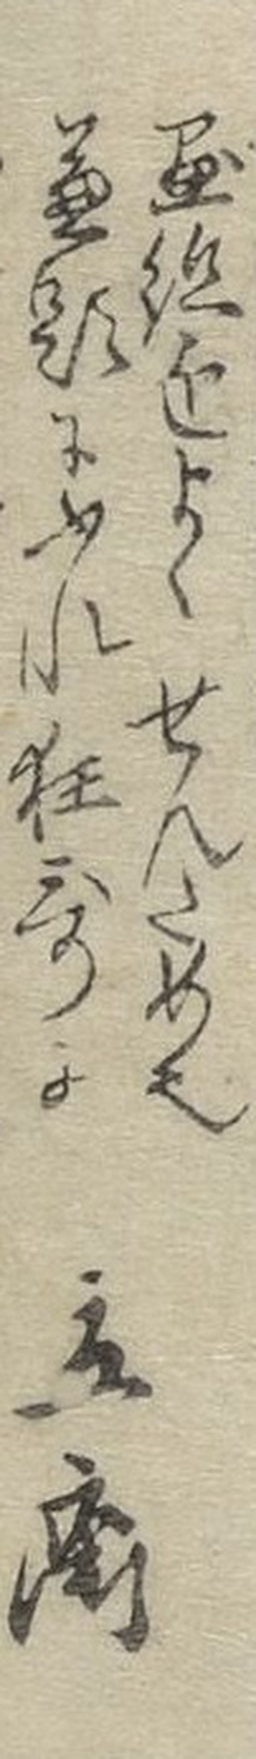兼題にふれ狂哥に立斎
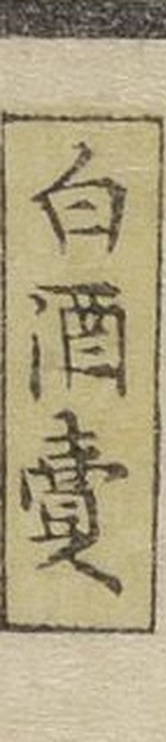白酒売
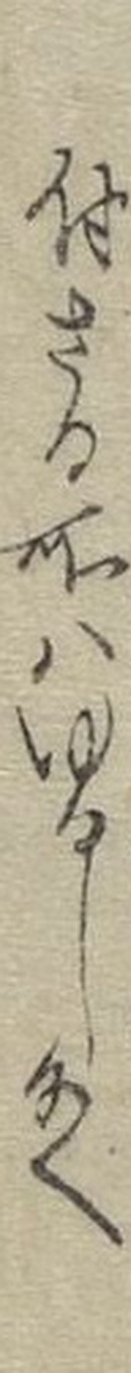付さる所はゆるし給へ

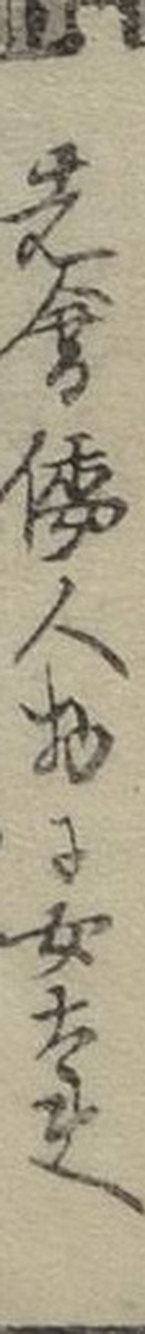先会倭人物に女太夫
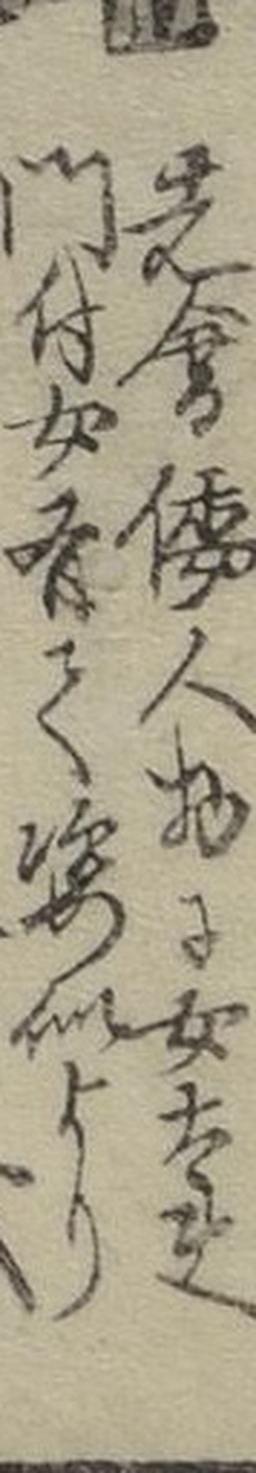門付女有て姿似より
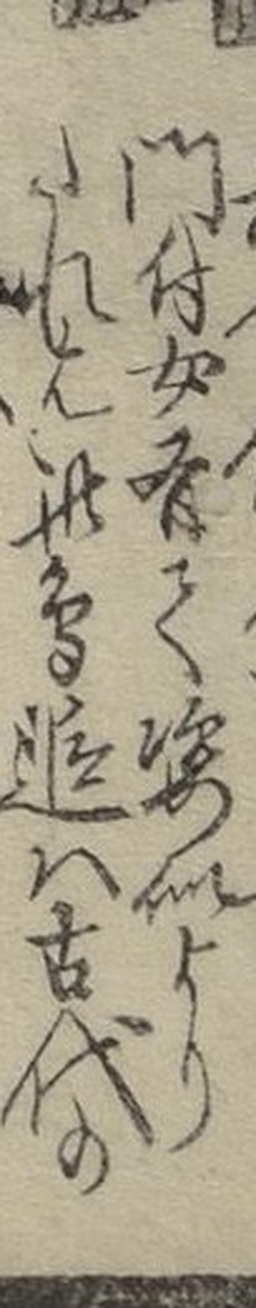たれは此鳥追は古代の
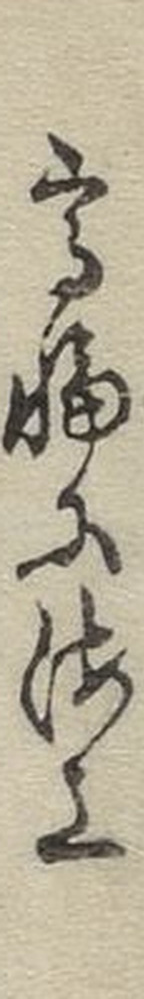高輪に海上
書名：Picture Album of People with Kyōka (Light Verse) (Kyōka shiki jinbutsu 狂歌四季人物)
